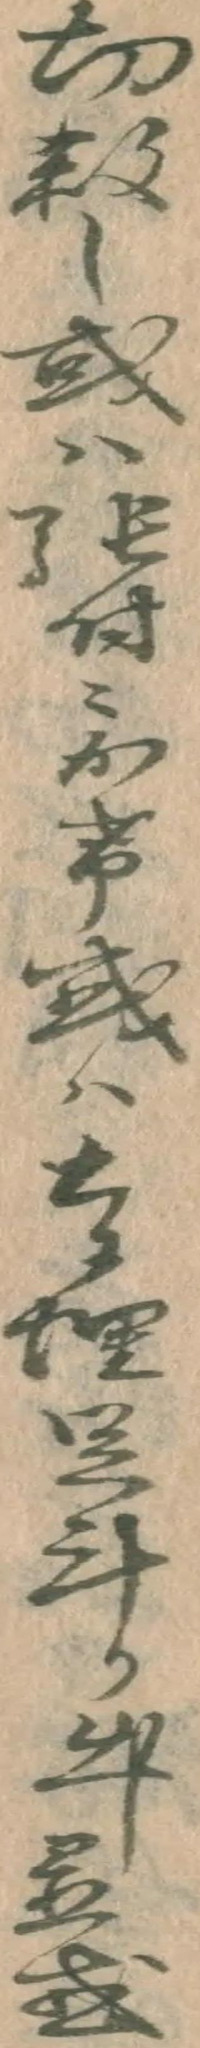切殺し或は張付にかけ或は土に埋足斗り出し置或
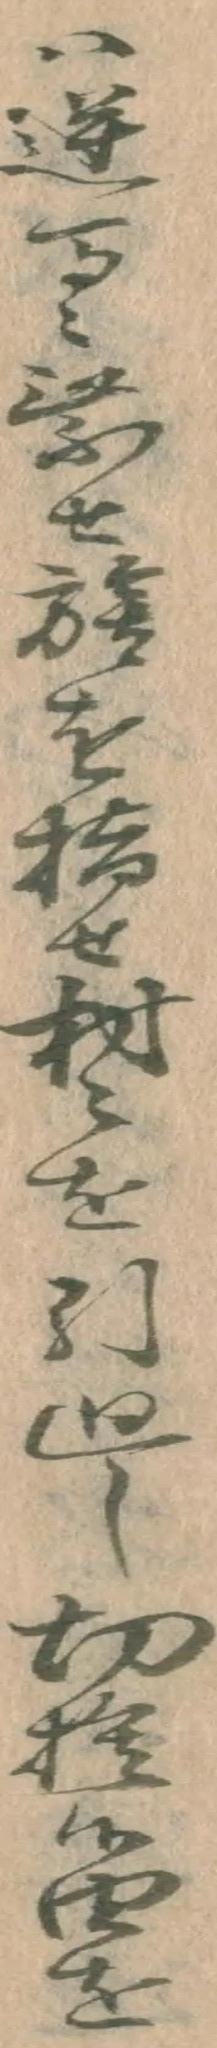は逆馬に乗せ旗を指せ村々を引廻し切捨候由を
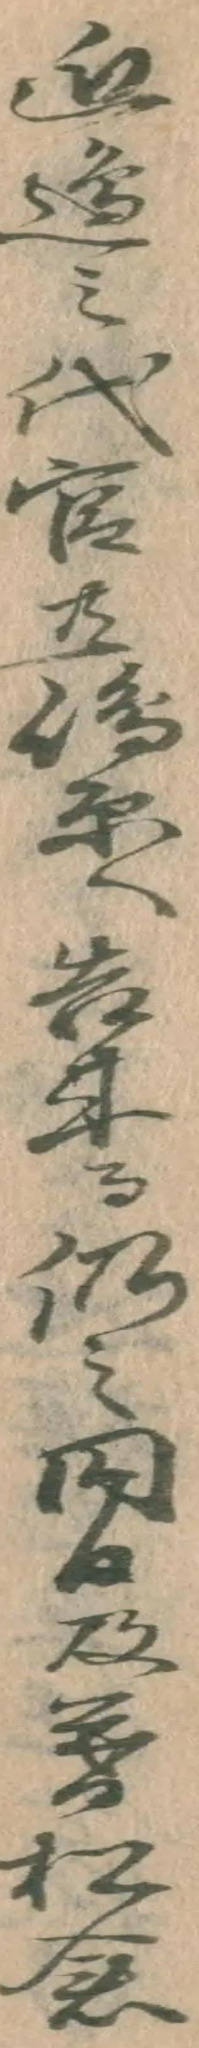近辺之代官共島原へ告来る仍之同日及暮松倉
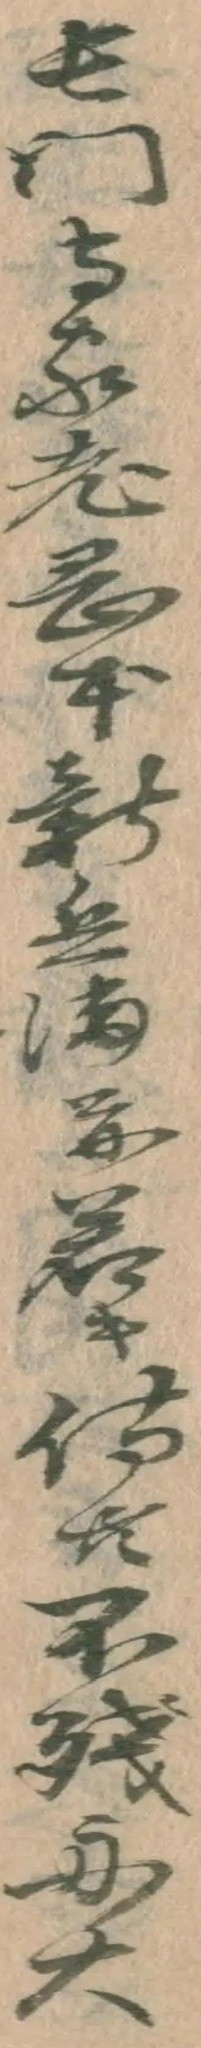長門守家老岡本新兵衛并若き侍共不残舟大
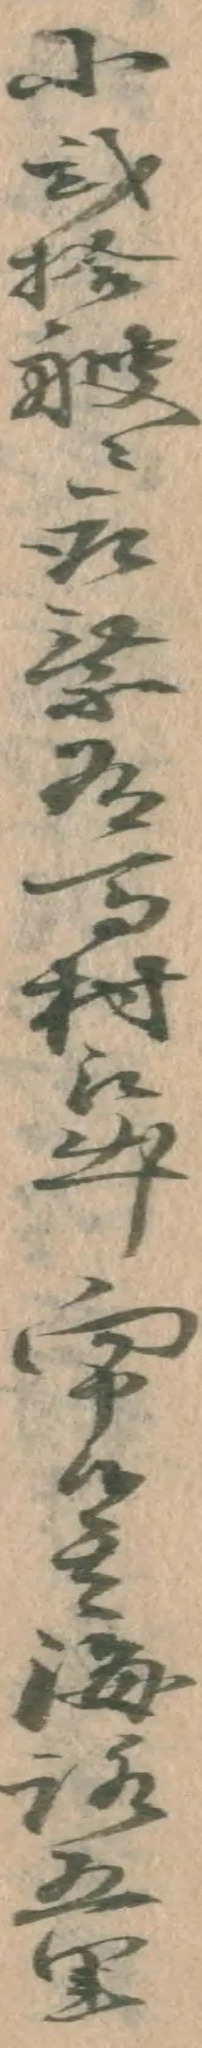小弐拾艘に取乗有馬村え出し向申候其海路五里
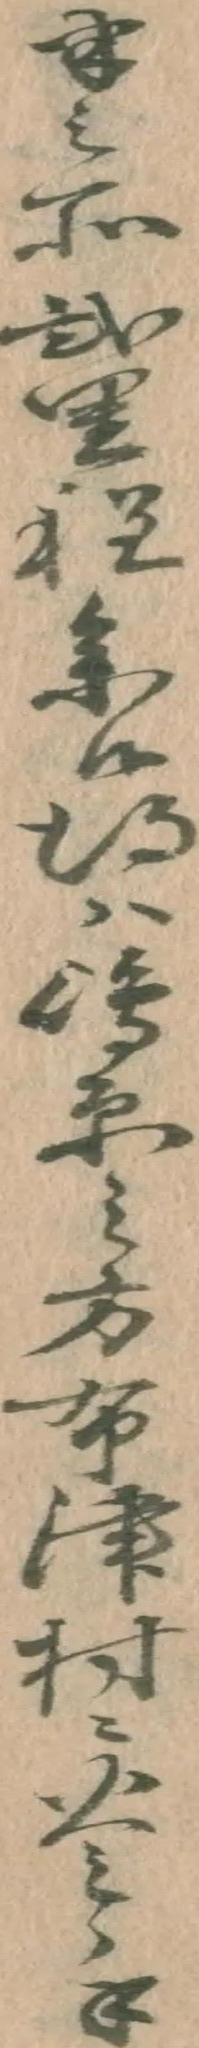半之所弐里程参候得しは島原之方布津村に火之手
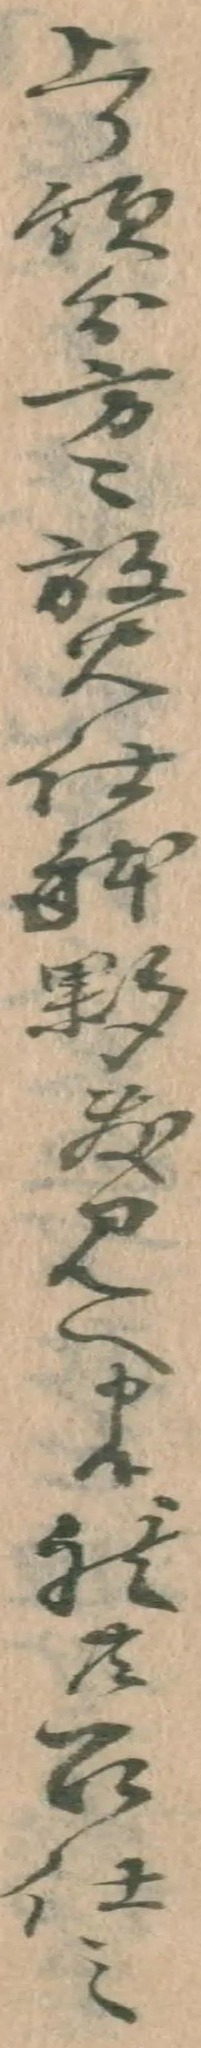上り領分方々放火仕体夥敷見へ申候然共召仕之
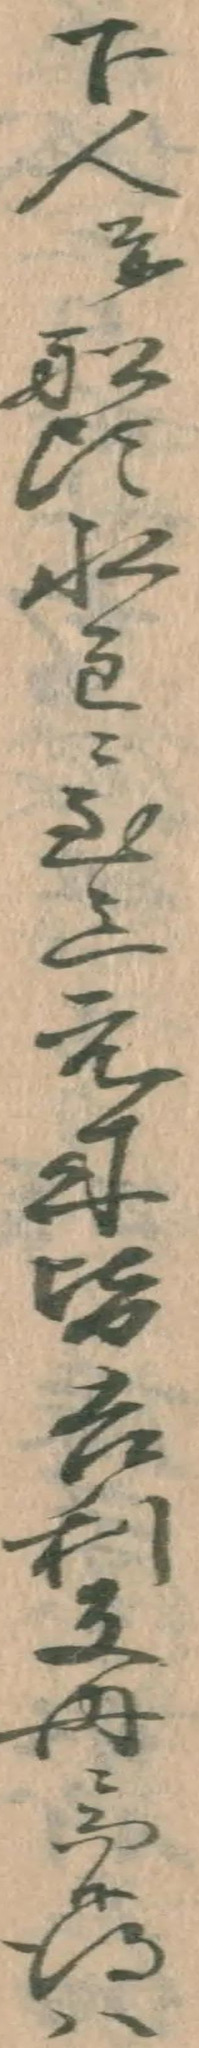下人并船頭水主に至迄元来皆吉利支丹に而候得は
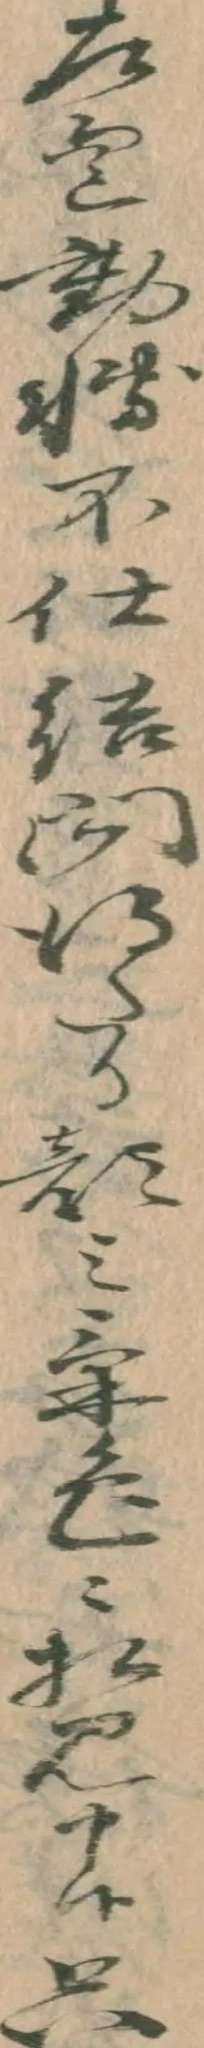左而已動転不仕結聞得たり顔之気色に相見申候只
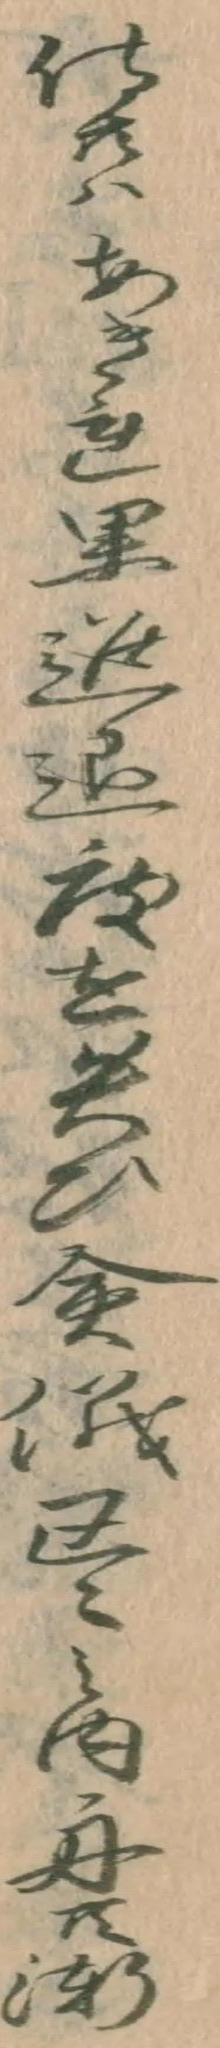侍共はあきれ果進退度を失ひ僉儀区々之内舟共漸
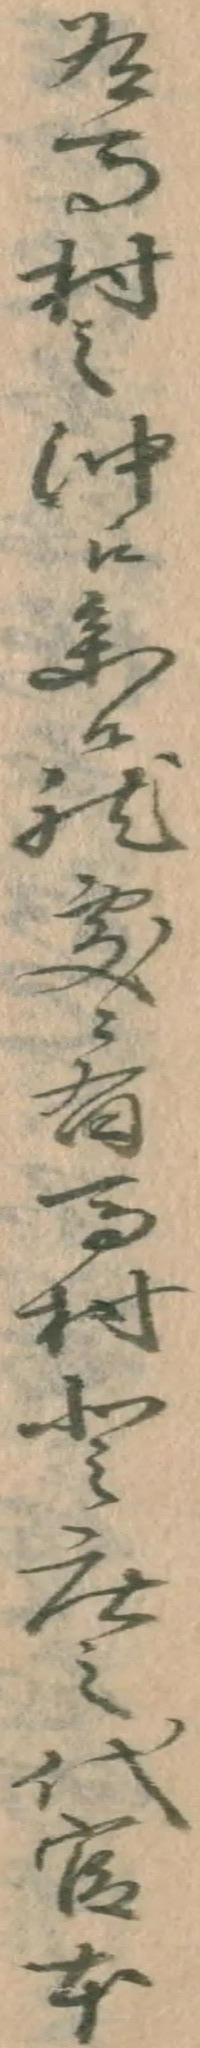有馬村之沖え参候然処に有馬村登庄之代官本
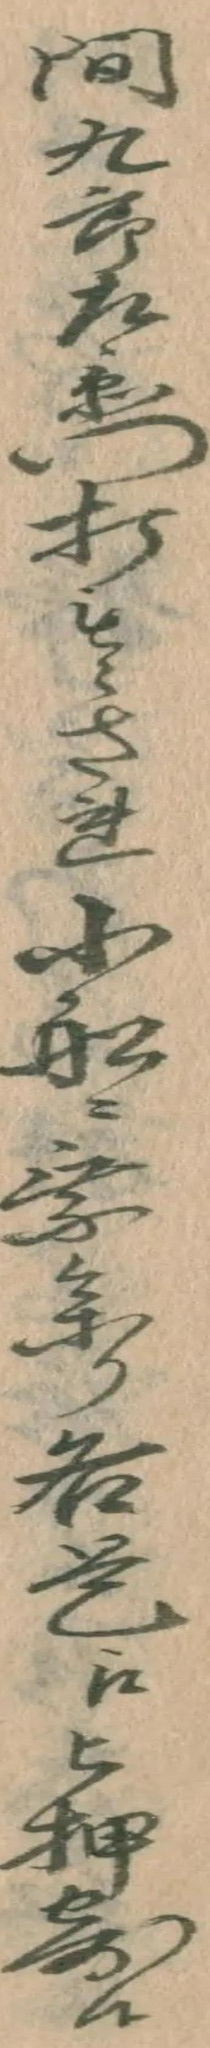間九郎左衛門打もらされ小船に乗参り各是え被押寄候
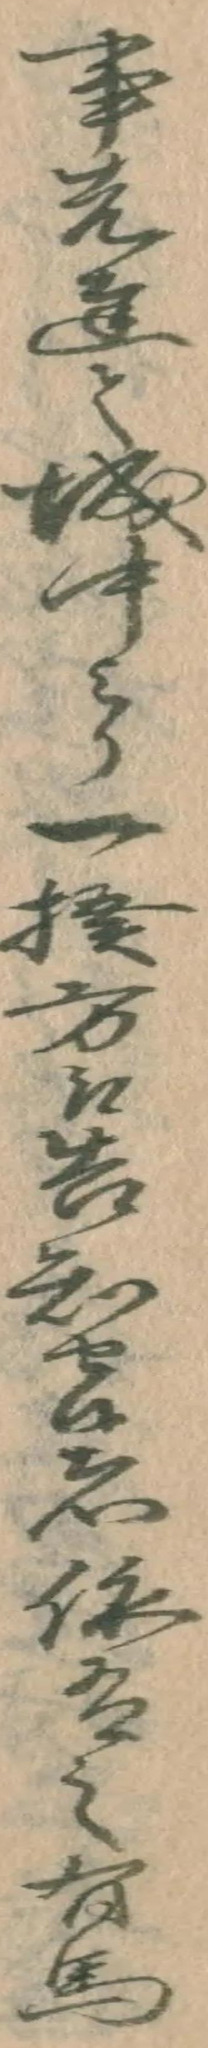事先達て城中より一揆方え告知せ候者依有之有馬
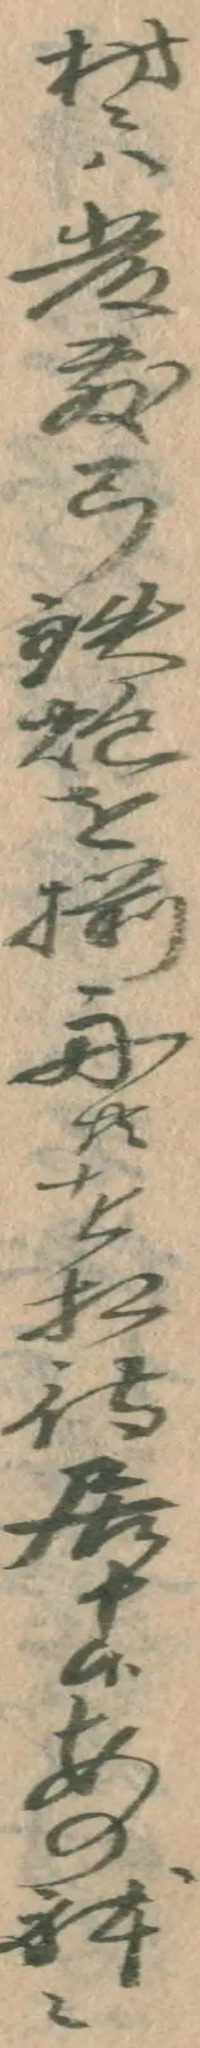村には厳敷弓鉄炮を揃舟共を相待居申候あの体に
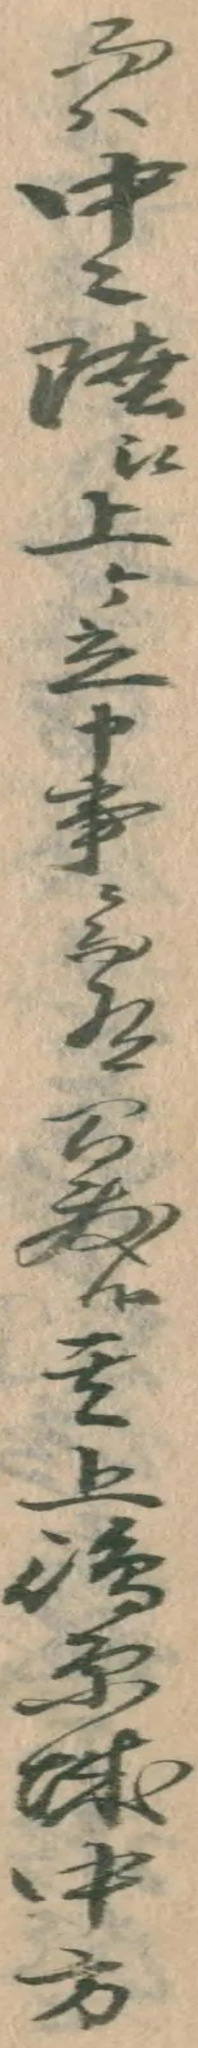而は中々陸え上け立申事に而有間敷候其上島原城中方
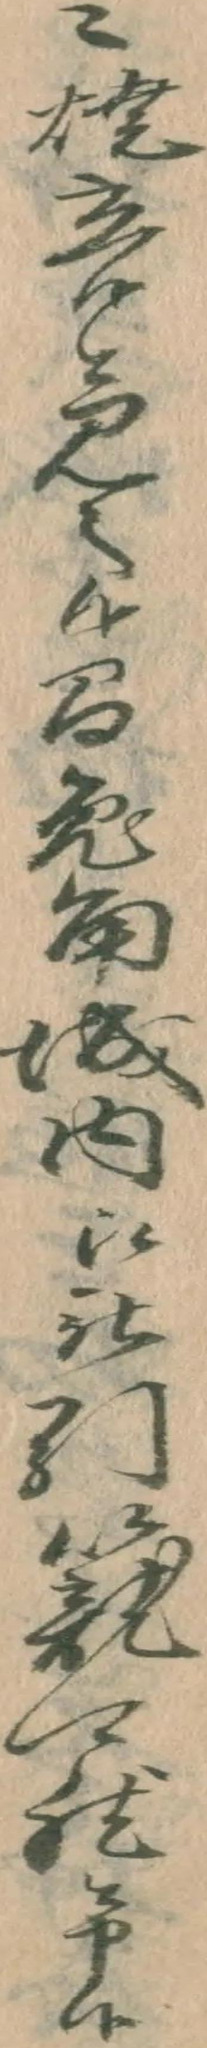々焼立候と見へ候間兎角城内え被引籠可然と申候
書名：切支丹御退治記 49巻. [1]
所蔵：国立国会図書館 National Diet Library, JAPAN
